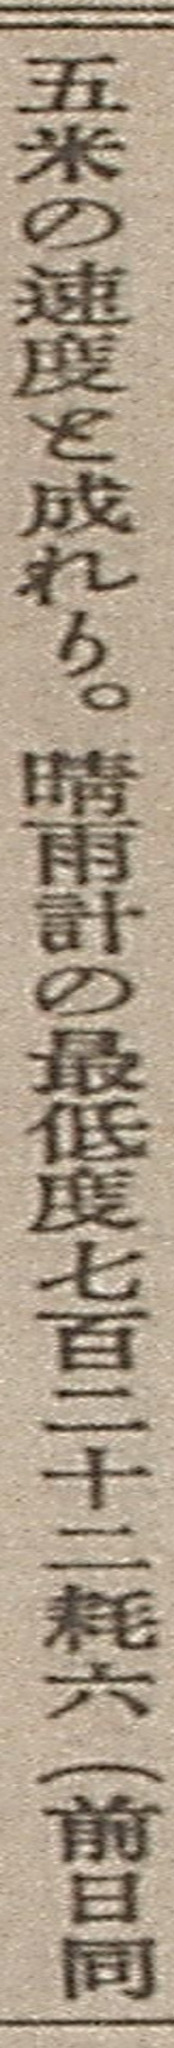五米の速度と成れり。晴雨計の最低度七百二十二粍六（前日同
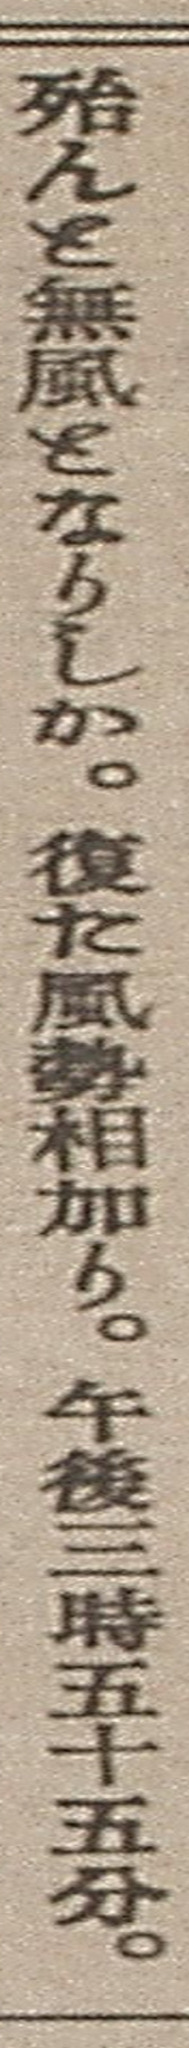殆んと無風となりしか。復た風勢相加り。午後三時五十五分。
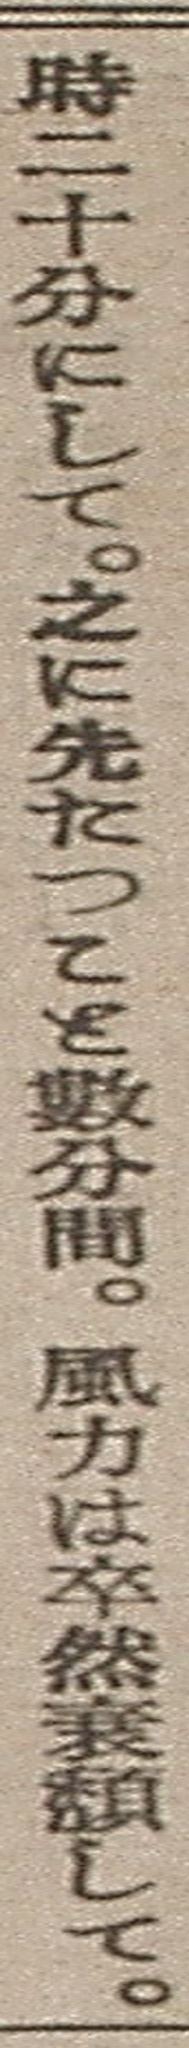時ニ十分にして。之に先たつこと数分間。風力は卒然衰頽して。
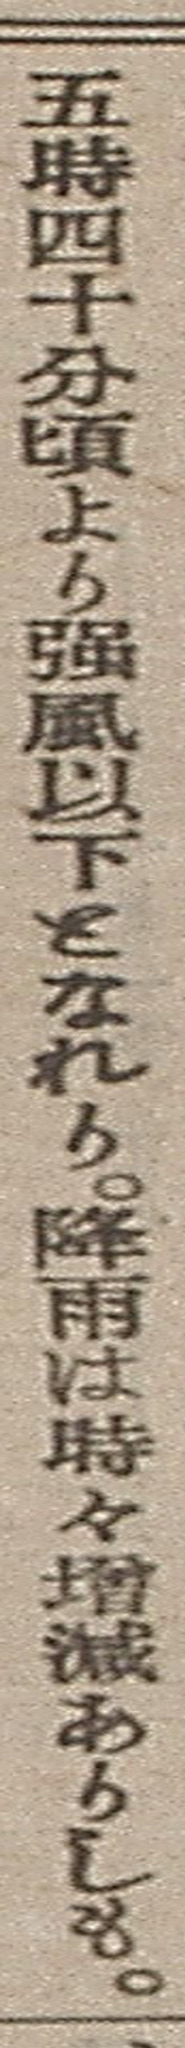五時四十分頃より強風以下となれり。降雨は時々増減ありしも。
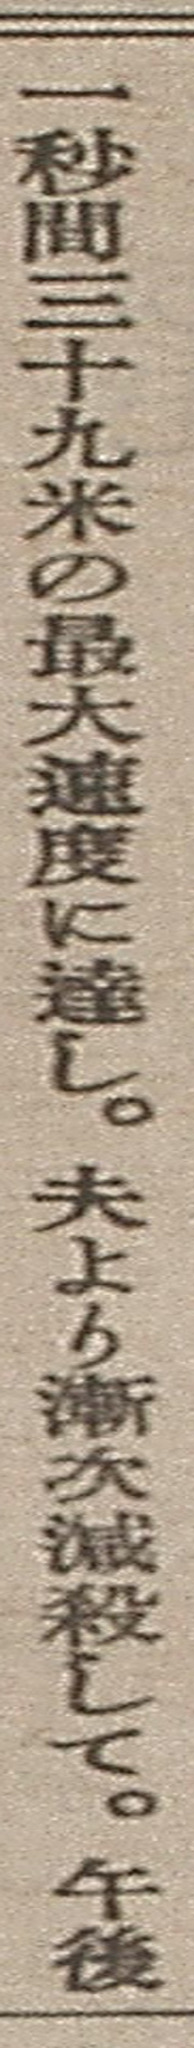一秒間三十九米の最大速度に達し。夫より漸次減殺して。午後
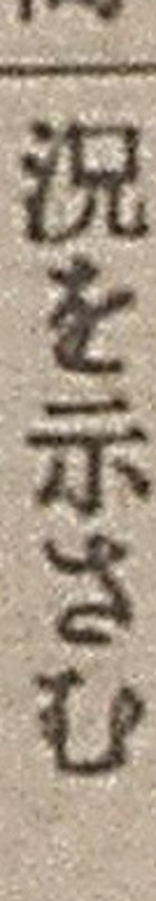況を示さむ
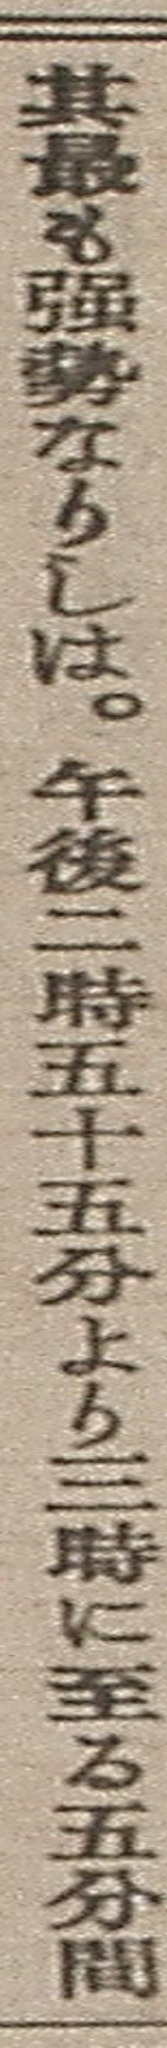其最も強勢なりしは。午後二時五十五分より三時に至る五分間
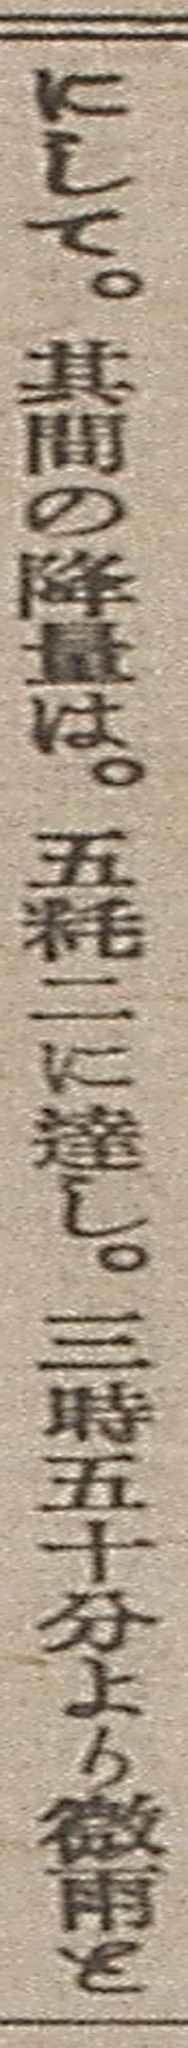にして。其間の降量は。五粍ニに達し。三時五十分より微雨と
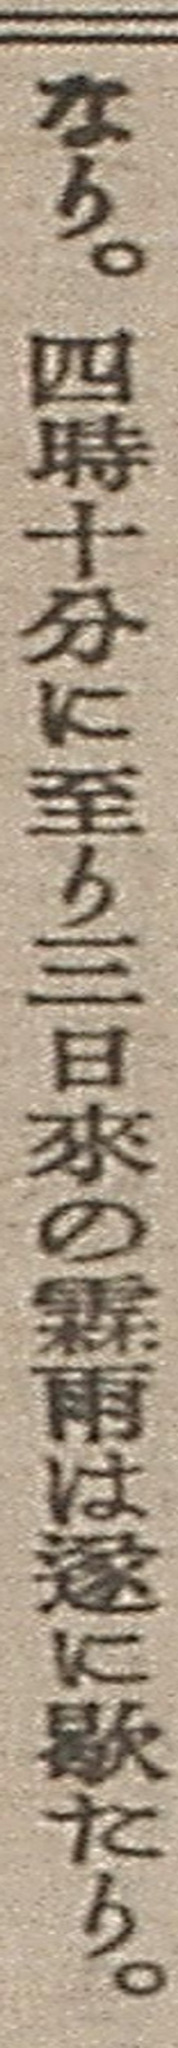なり。四時十分に至り三日来の霖雨は遂に歇たり。
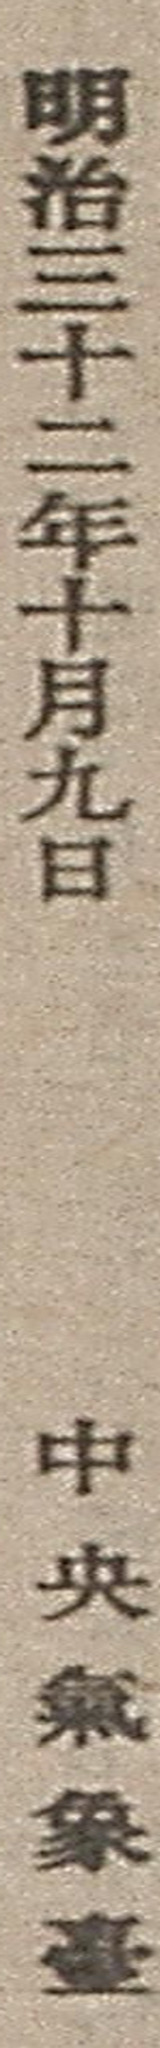明治三十二年十月九日中央気象台
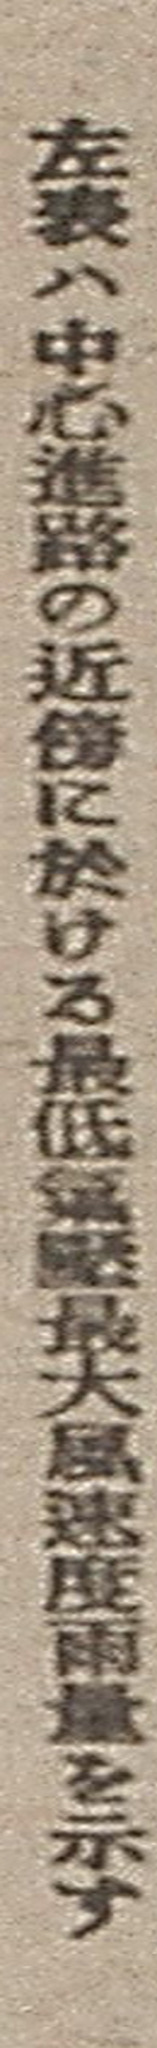左表ハ中心進路の近傍に於ける最低気圧最大風速度雨量を示す

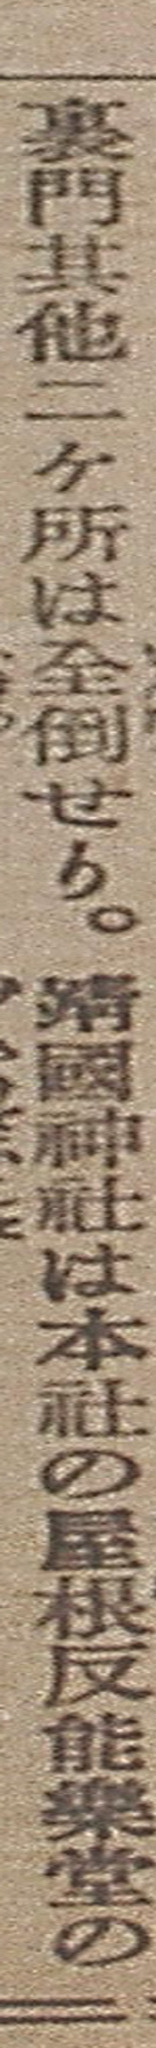裏門其他二ケ所は全倒せり。靖国神社は本社の屋根反能楽堂の
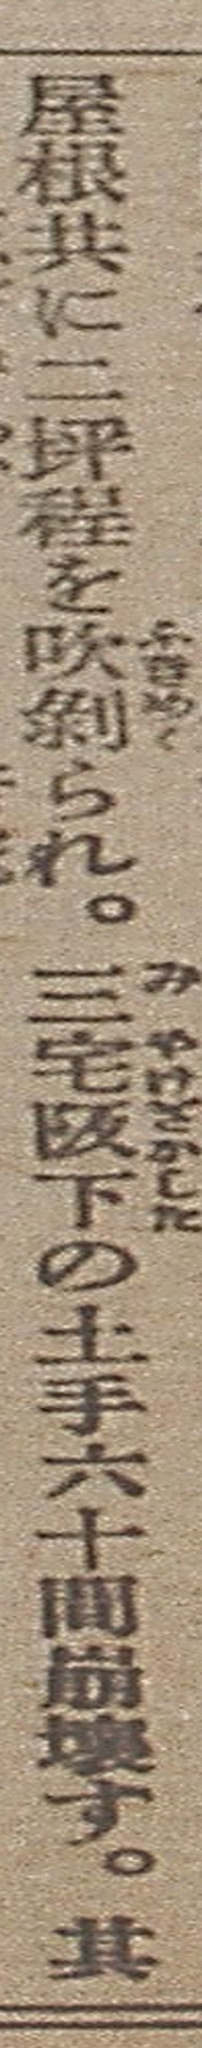屋根共に二坪程を吹剥られ。三宅坂下の土手六十間崩壊す。其
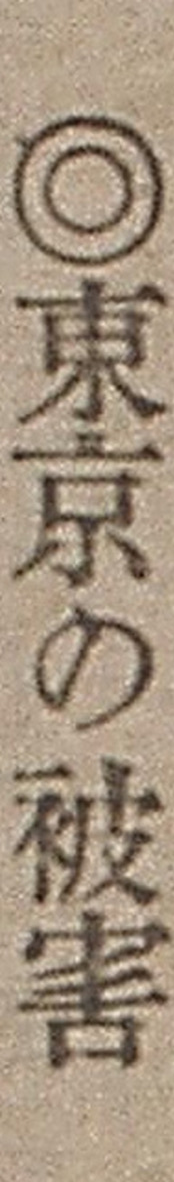◎東京の被害
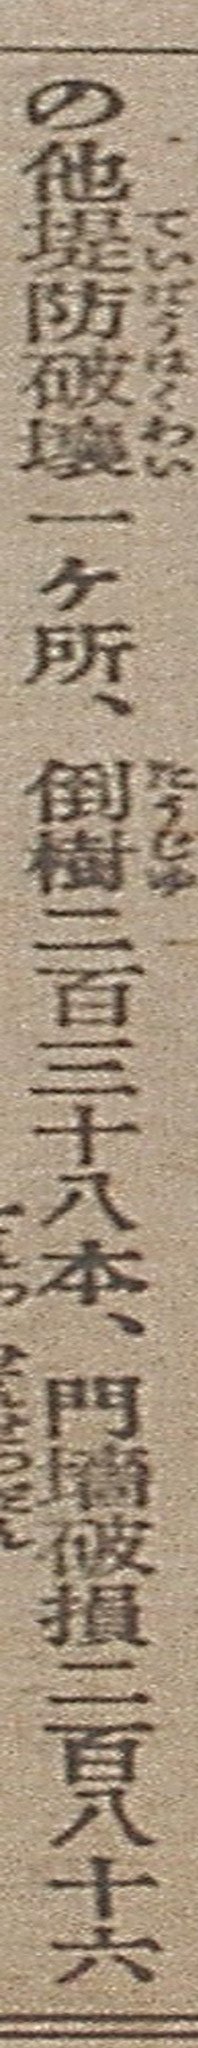の他堤防破壊一ヶ所、倒樹二百三十八本、門墻破損二百八十六
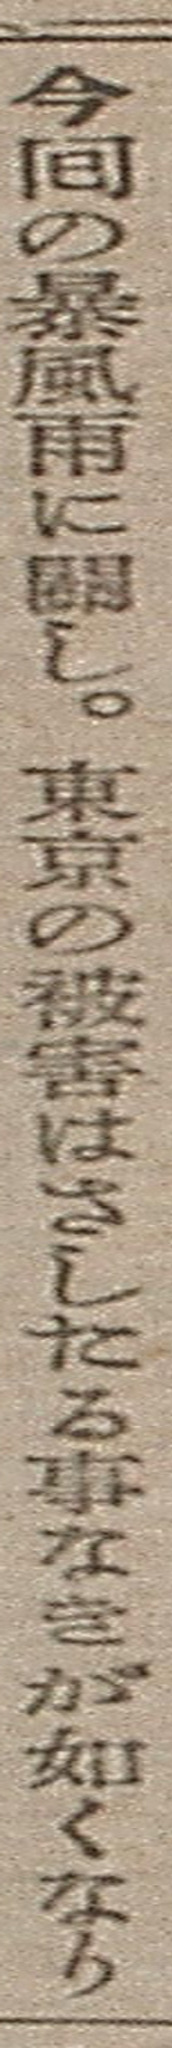今回の暴風雨に関し。東京の被害はさしたる事なきが如くなり
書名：風俗畫報臨時増刊第百九十九號　明治三十二年十月各地災害圖會（前編之續）
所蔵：東京大学地震研究所図書室 Earthquake Research Institute Library, The University of Tokyo, JAPAN
